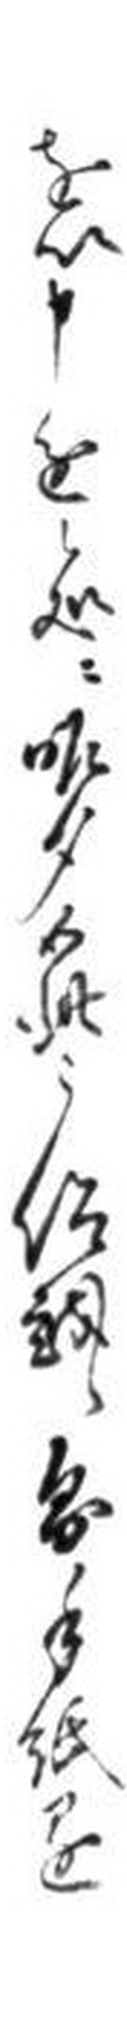を以申進候処ニ昨夕如此被仰越候即手紙懸
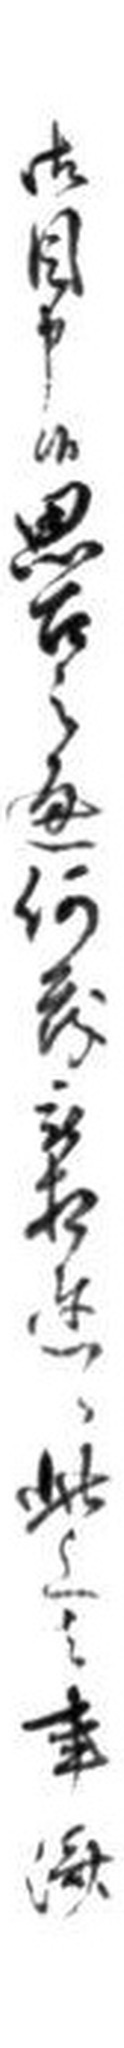御目申候思召之通何茂被相達候此上者事済
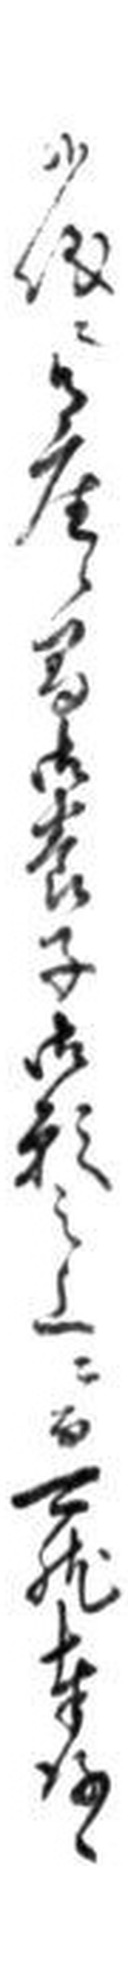候儀ニ御座候間御養子御願之上ニ而可然奉存候
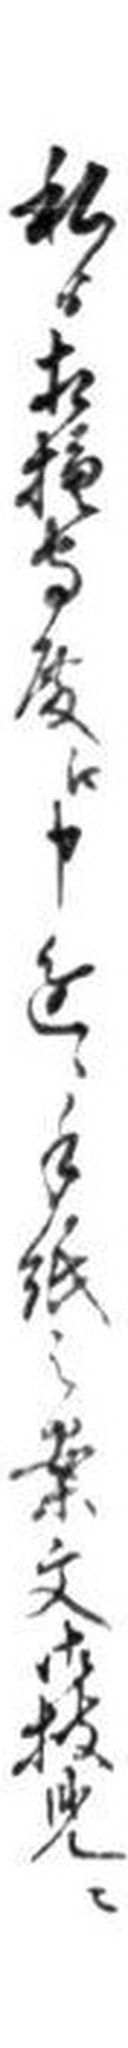私ゟ相模守殿江申進候手紙之案文御披見ニ
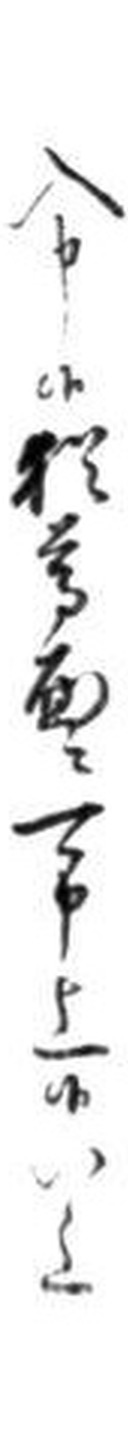入申候猶尊面ニ可申上候以上
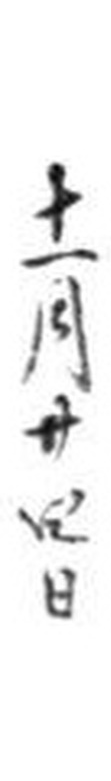十一月廿四日
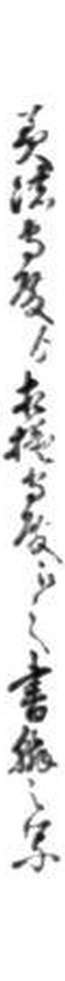美濃守殿ゟ相模守殿江之書翰之写
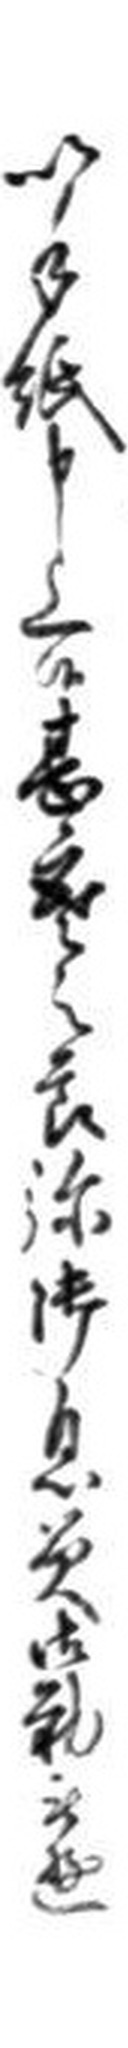以手紙申上候甚寒之節弥御息災御勤被遊
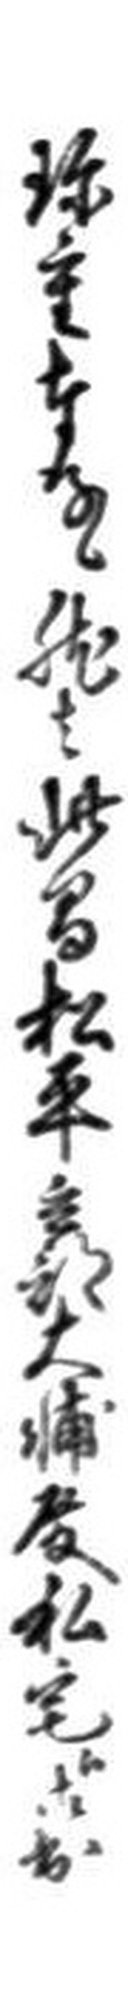珍重奉存候然者此間松平兵部大輔殿私宅江御出
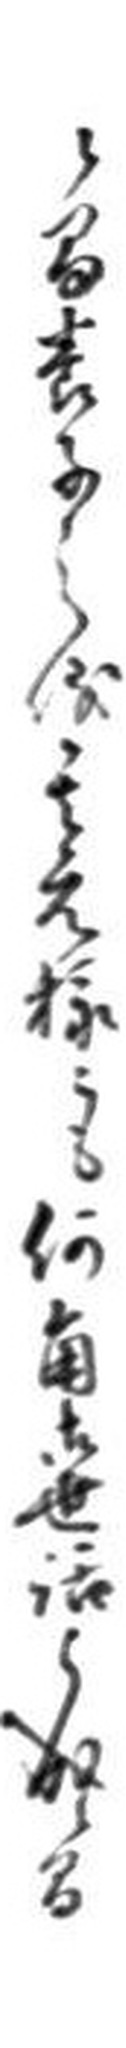候間養子之儀其元様ニも何角御世話被成候間
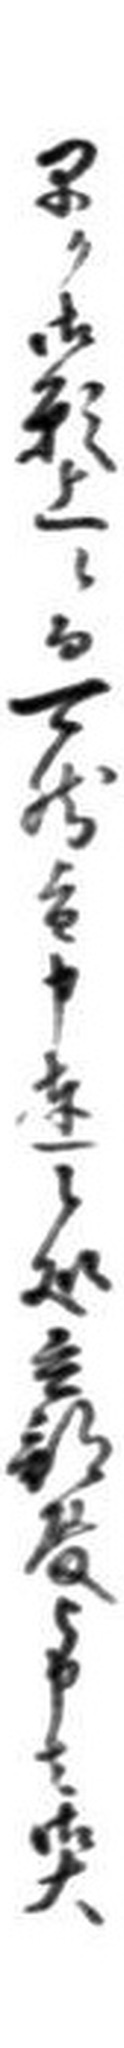早ク御願上ニ而可然旨申達候処兵部殿被申者御大
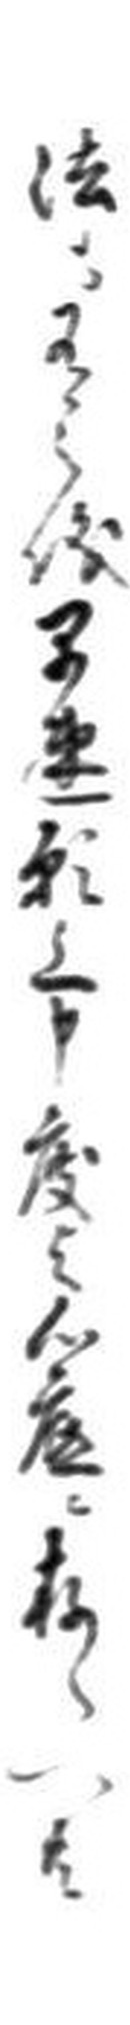法も有之儀早速願上申度与心底ニ存候へ共
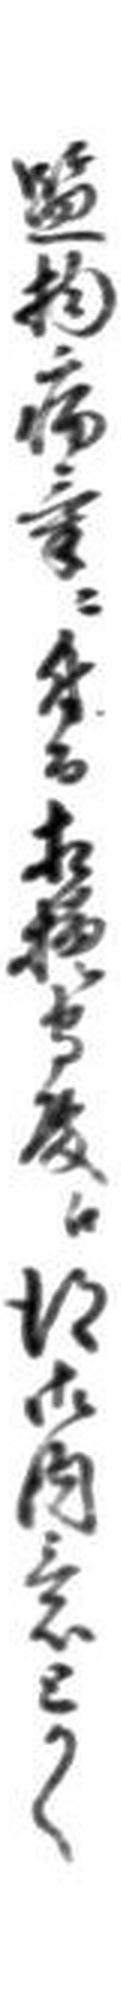監物病気ニ付而相模守殿江得御内意とかく
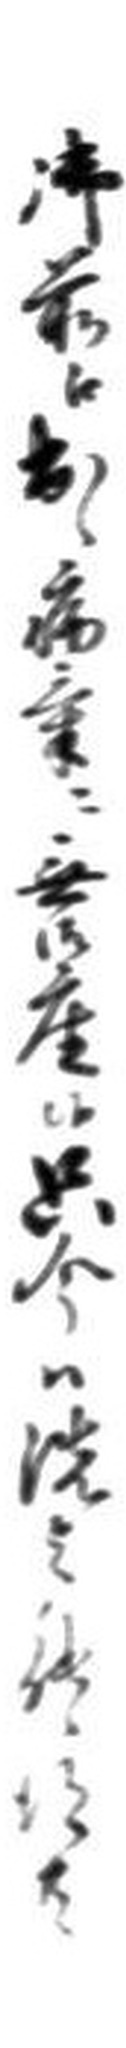御前江出候病気ニ無御座候只今ハ洗与能候得共
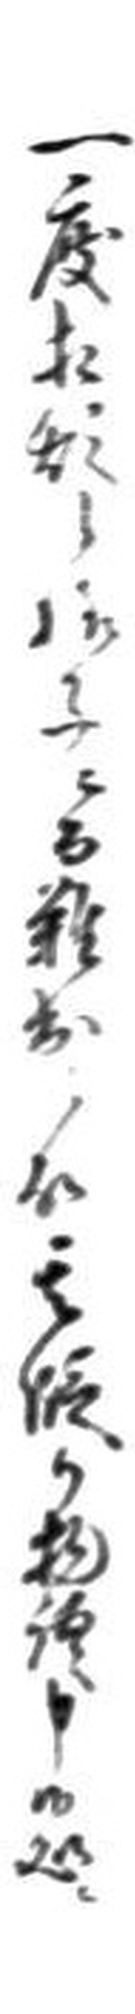一度相煩候様子ニ而難出候故其段御物語申候処ニ
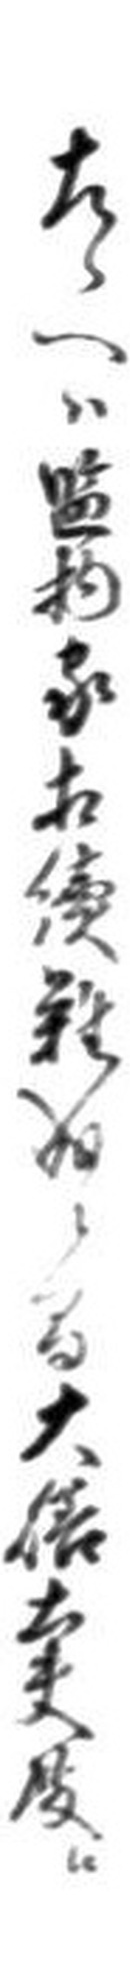左候へハ監物家相続難成候間大膳太夫殿江
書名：家譜 二十一 吉品公 従元禄十三年到同十四年
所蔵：福井県文書館 Fukui Prefectural Archives
